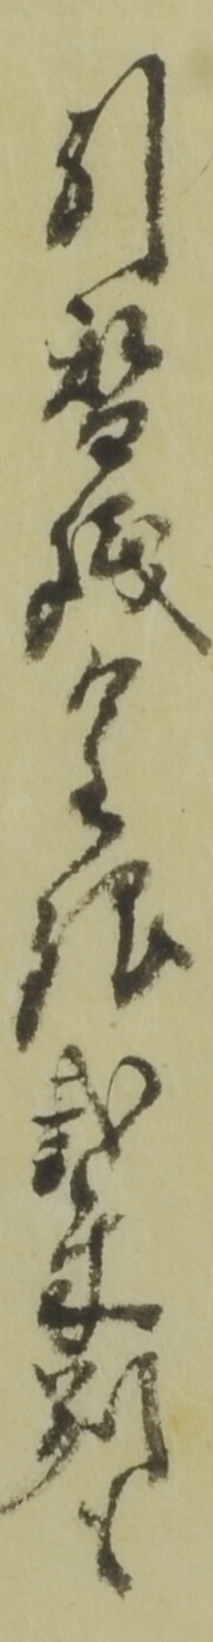引替残金銀弐朱判も
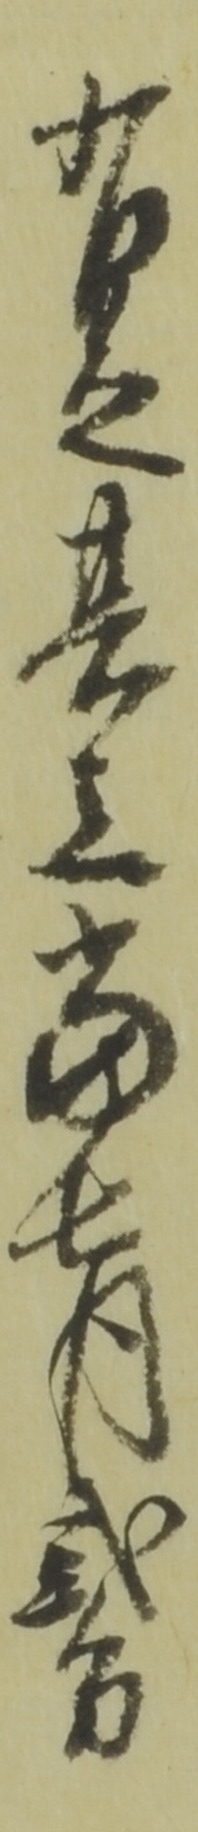有之其上当七月弐分
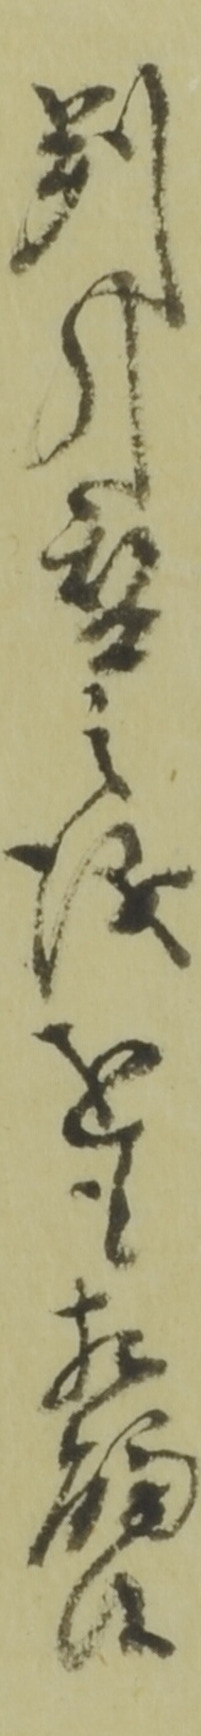判引替之儀をも相触候
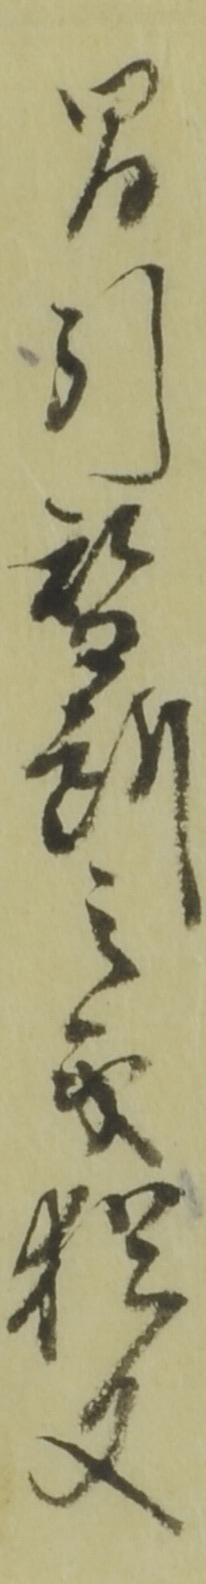間引替之儀猶又
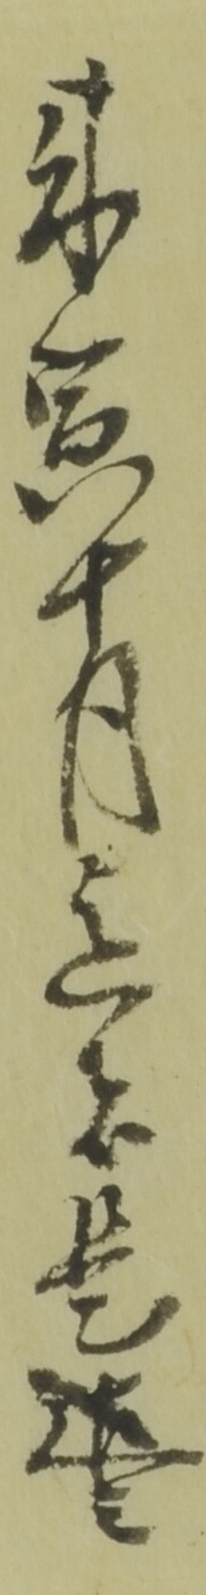来寅十月迄は是迄之
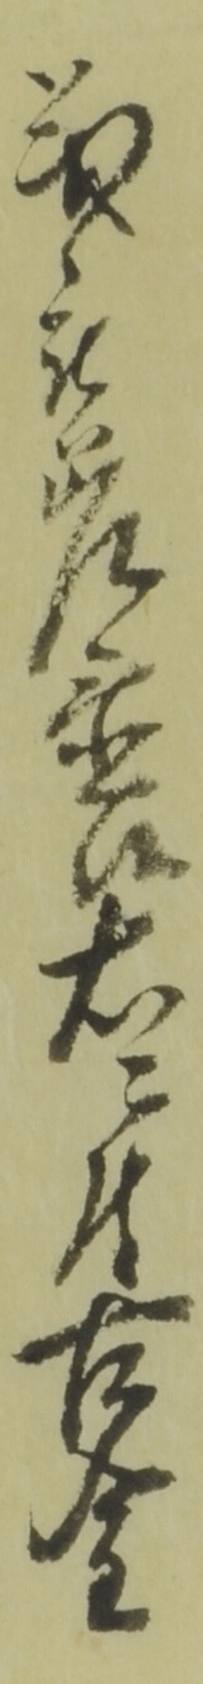義被差置候右ニ付古金
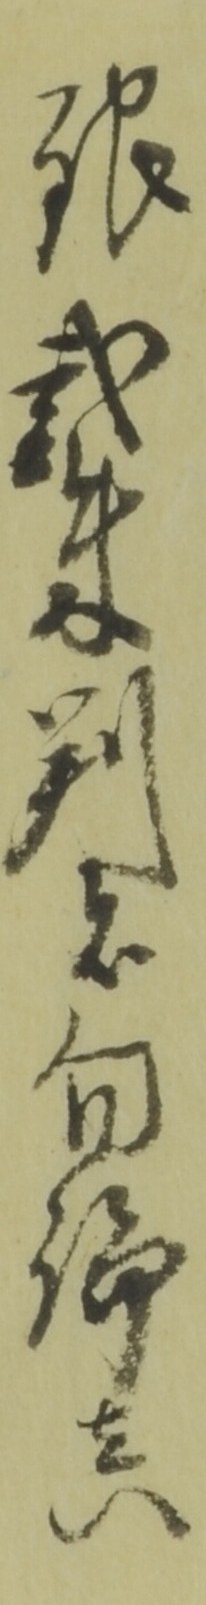銀弐朱判は勿論真
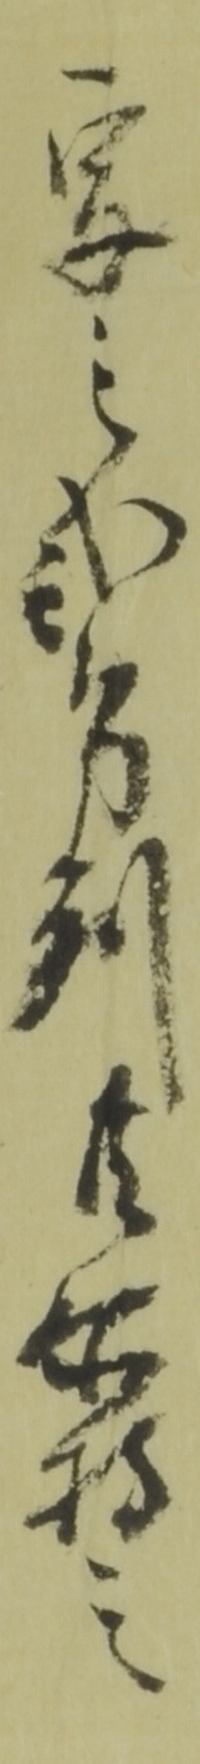字之弐分判共所持之
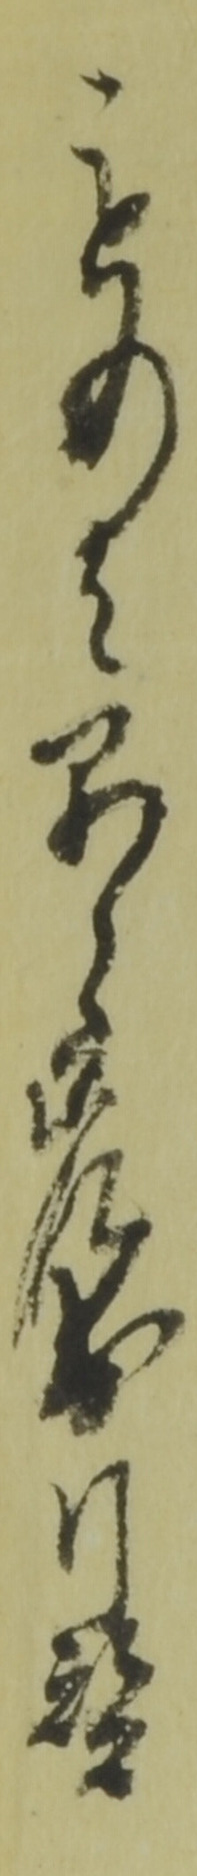ものは早々差出引替
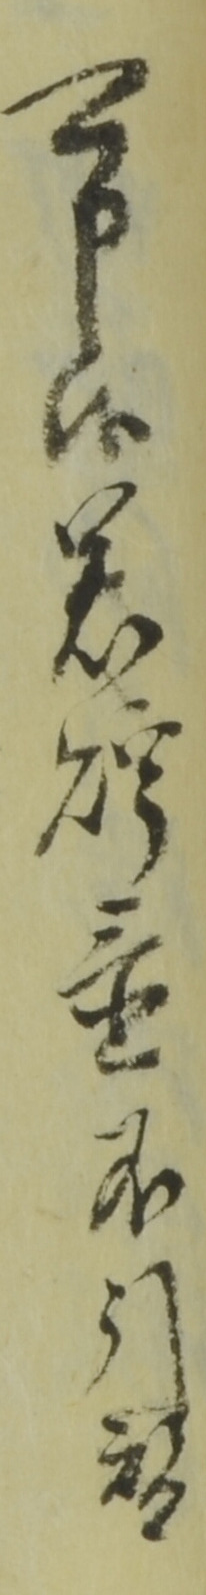可申候若貯置不引替
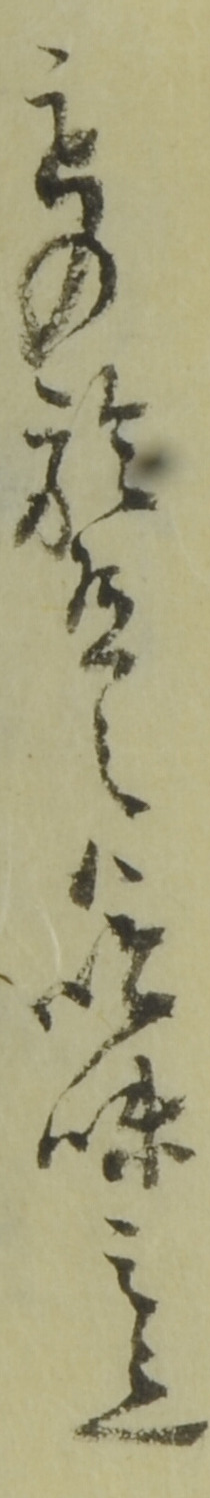もの於有之ハ吟味之上

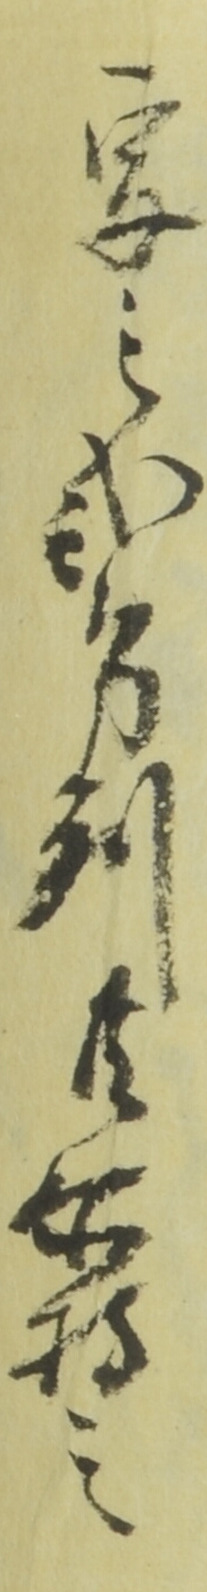字之弐分判共所持之
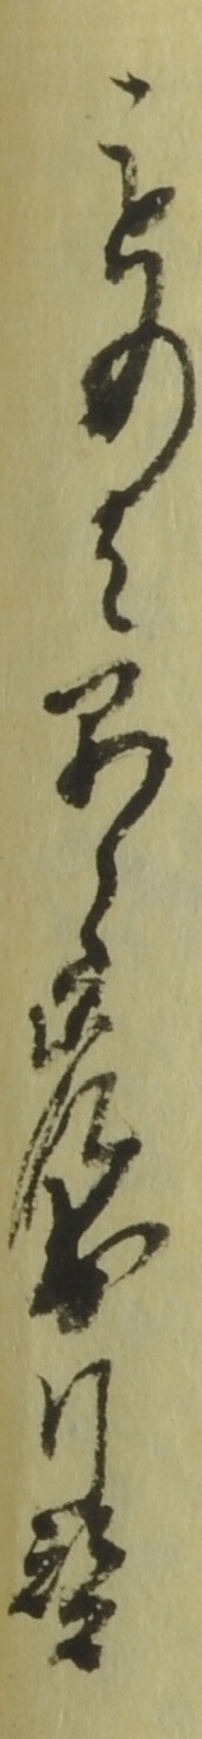ものは早々差出引替
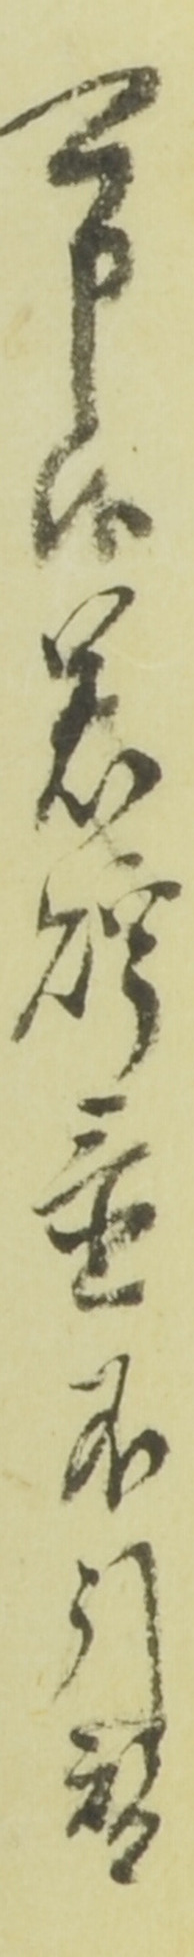可申候若貯置不引替
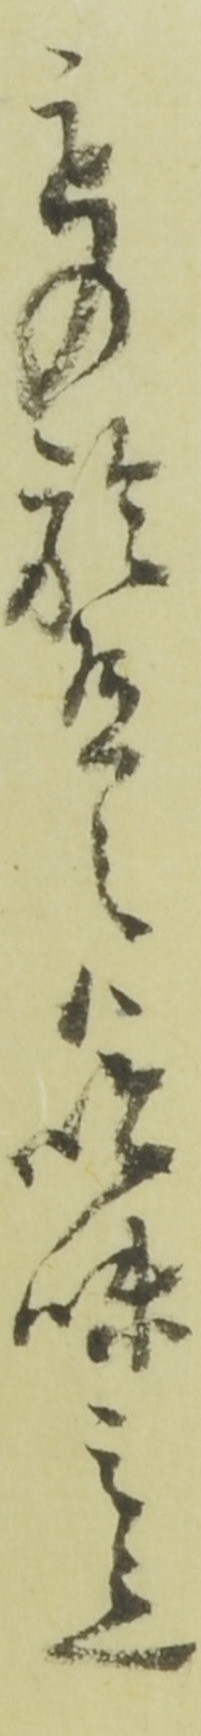もの於有之ハ吟味之上
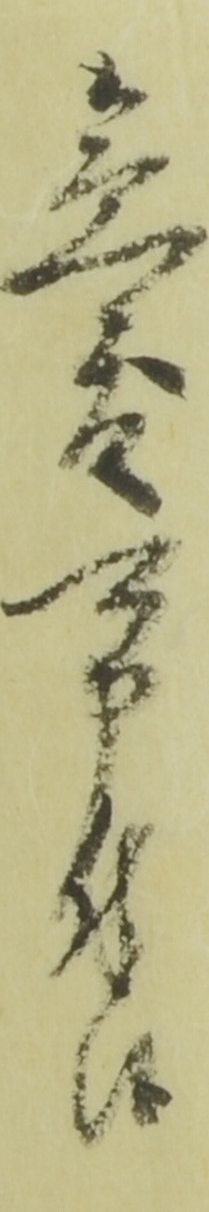急度可申付候
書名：御触書御書附控
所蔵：伊那市立高遠町図書館・合同会社AMANE
